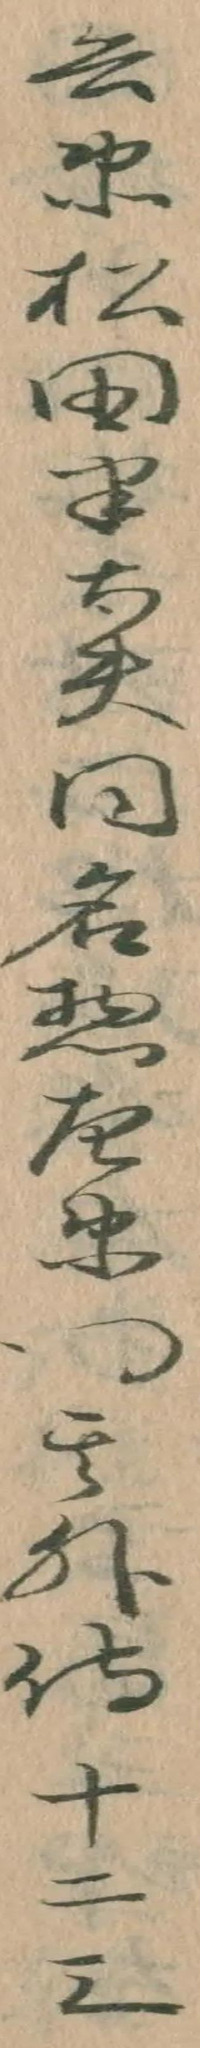兵衛松田半太夫同名惣左衛門其外侍十二三
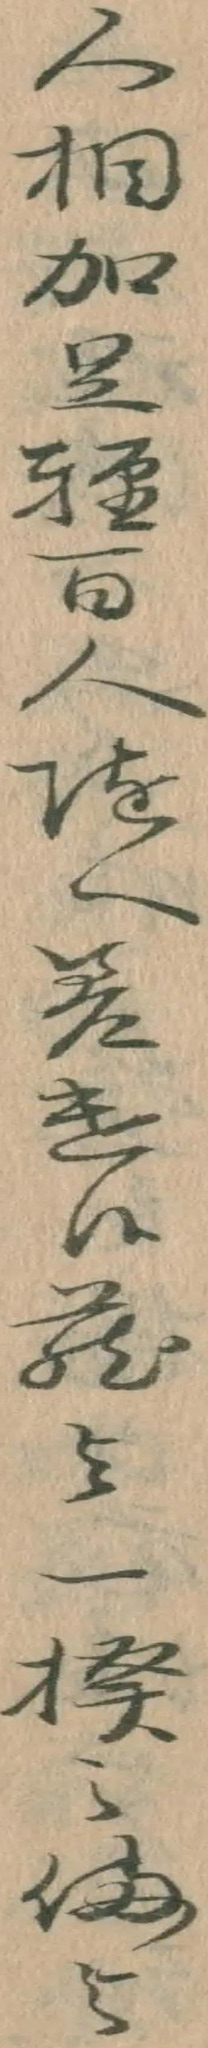人相加足軽百人随へ差遣候蔵与一揆之備与
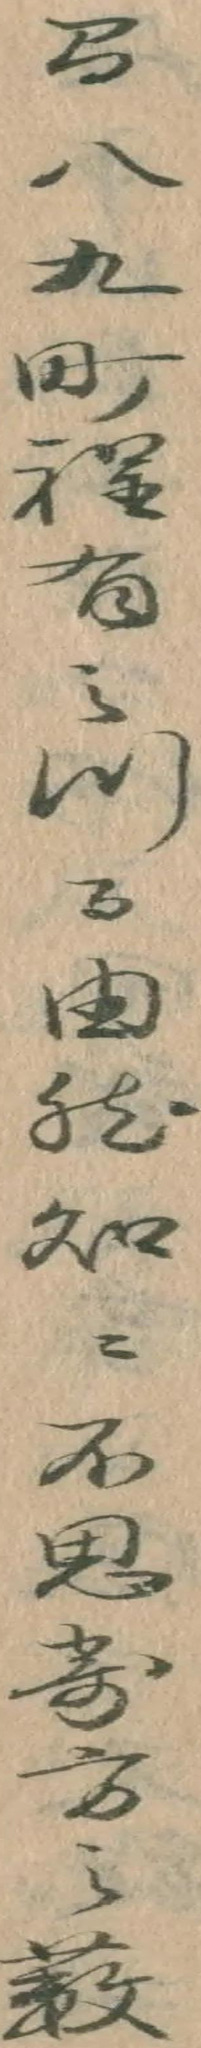間八九町程有之川る由然処に不思寄方之藪
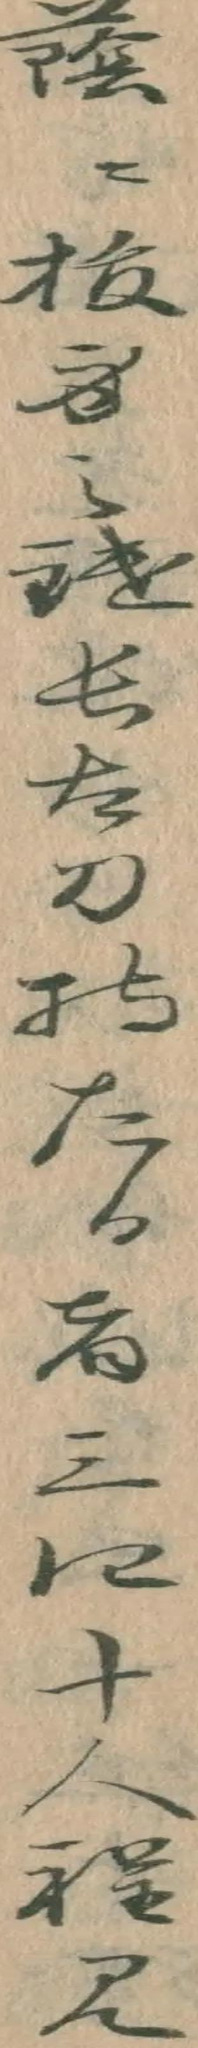蔭に抜身之鑓長太刀持たる者三四十人程見
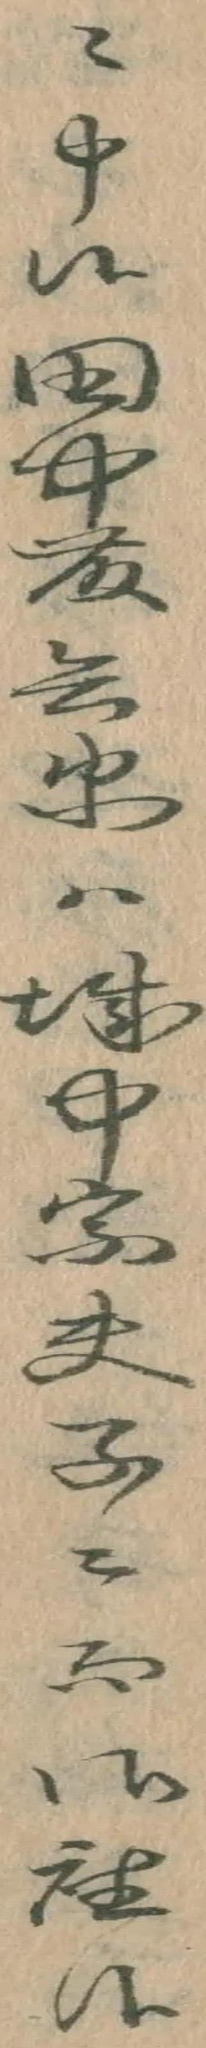に申候田中藤兵衛は城中宗夫子に而御座候
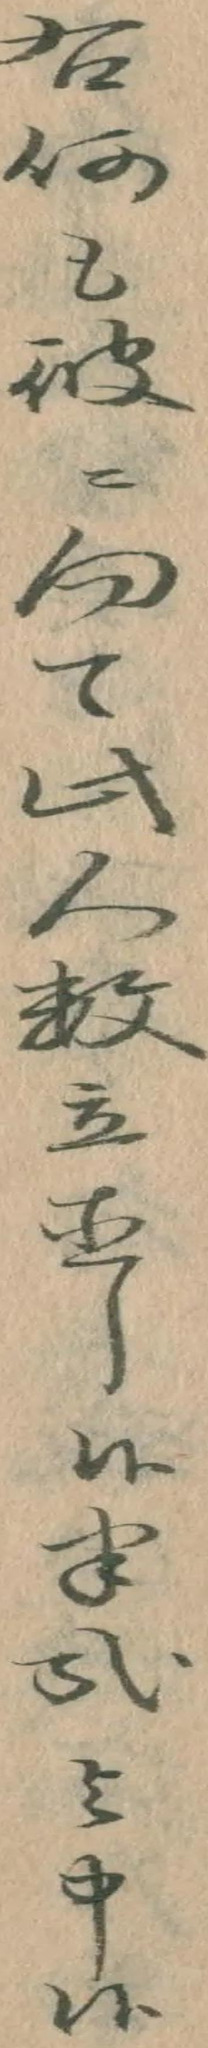右何も彼に向て此人数立直し候半哉与申候
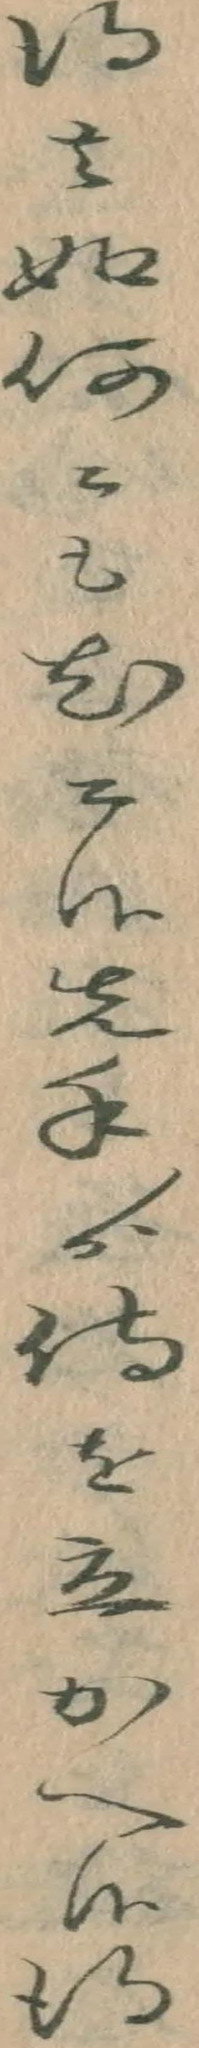得者如何にも尤に候先手ゟ侍を立かへ候得
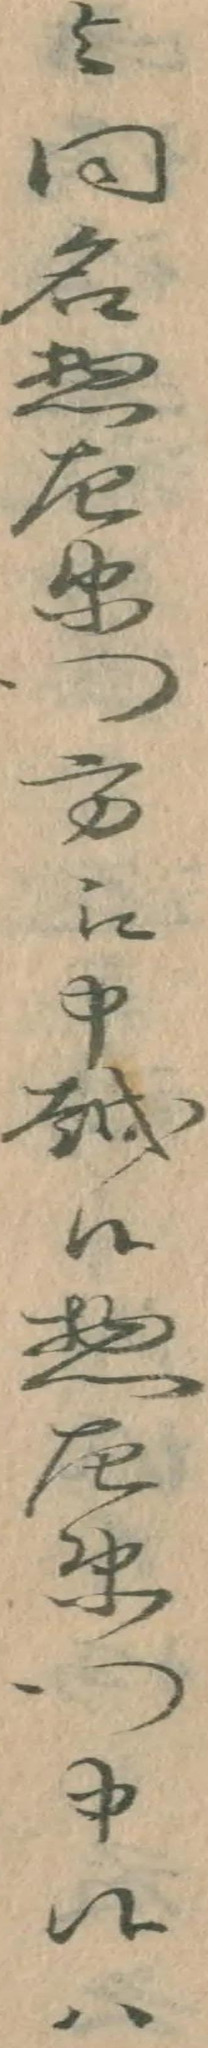与同名惣左衛門方江申越候惣左衛門申候は
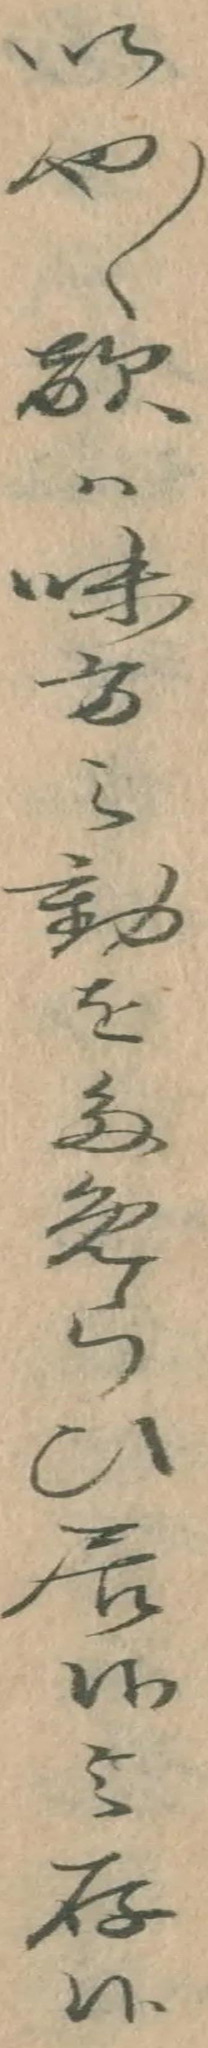以や〱敵は味方之動を多免らひ居候与存候

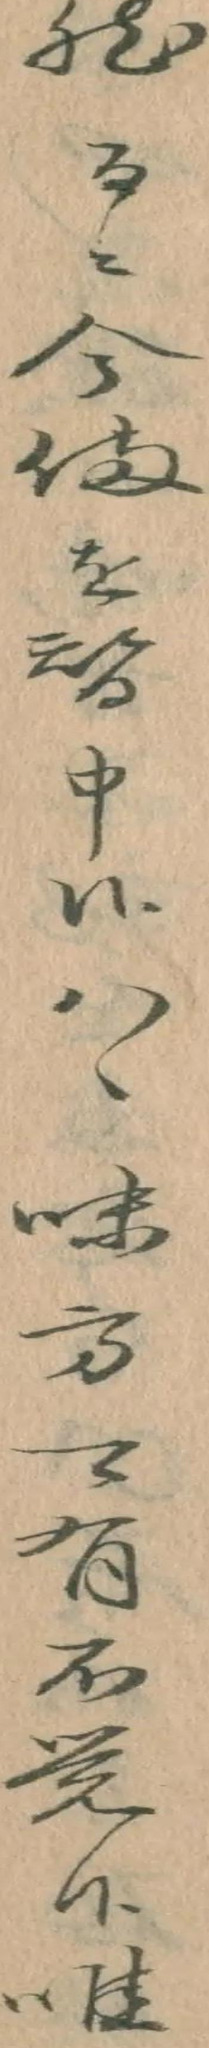然るに今備を替申候はゝ味方可有不覚候唯
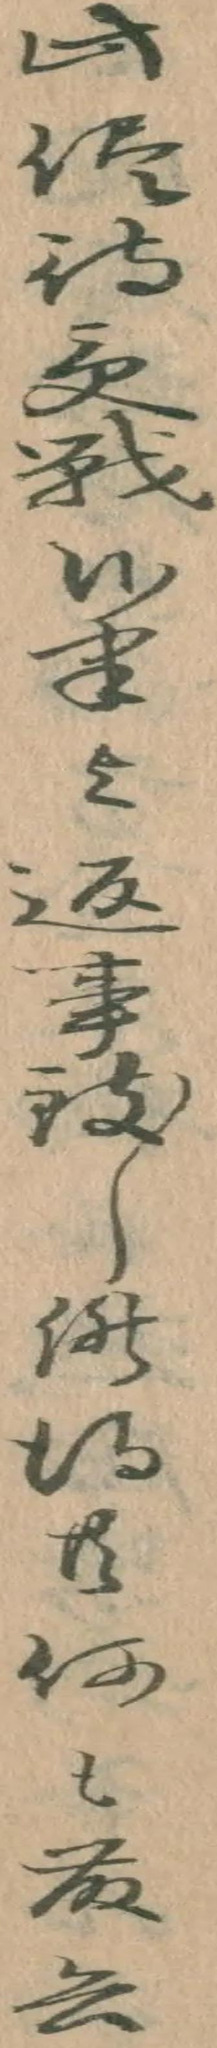此侭待受戦候半与返事致し候得共何も藤兵
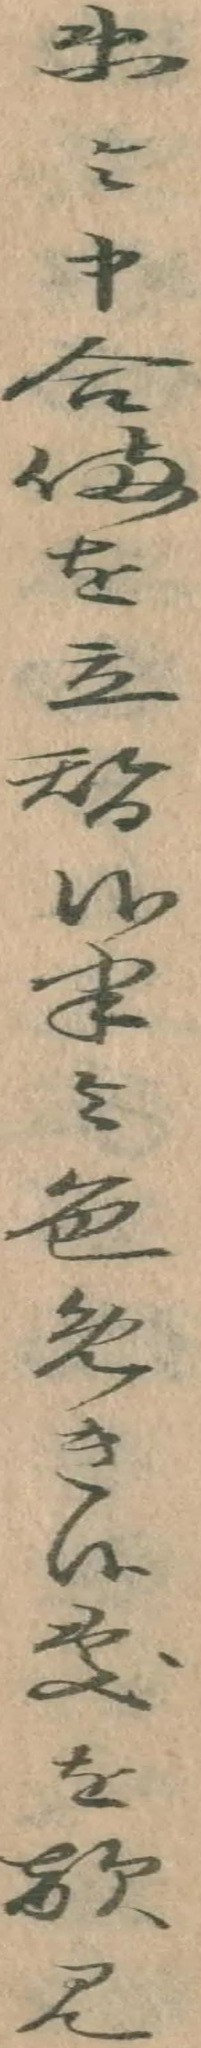衛与申合備を立替候半与色免き候處を敵見
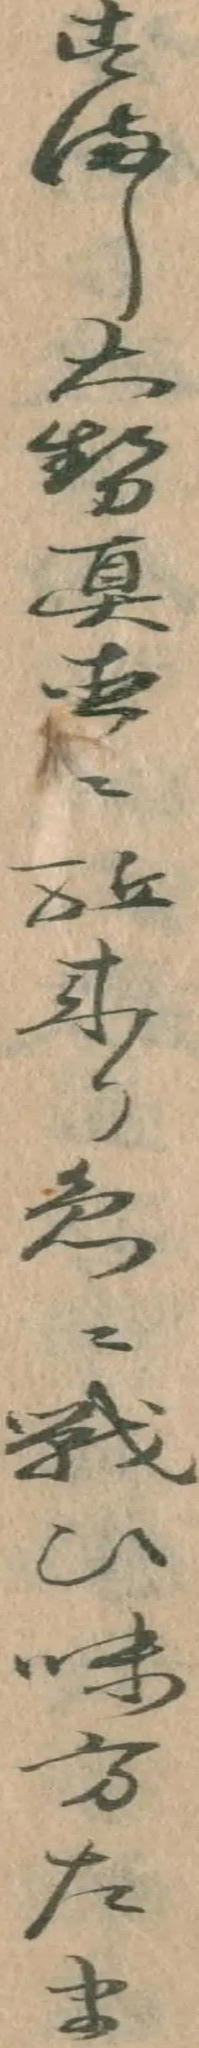春満し大勢真直に馳来り急に戦ひ味方たま
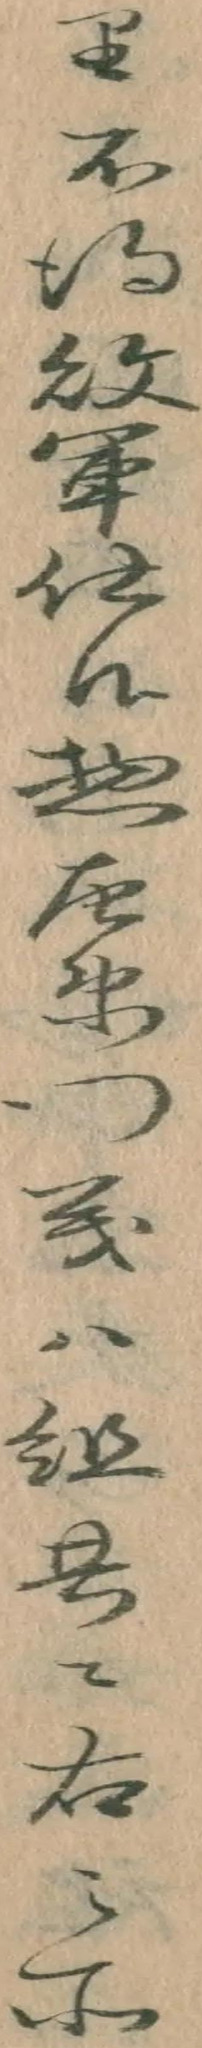里不得敗軍仕候惣左衛門義は組共に右之所
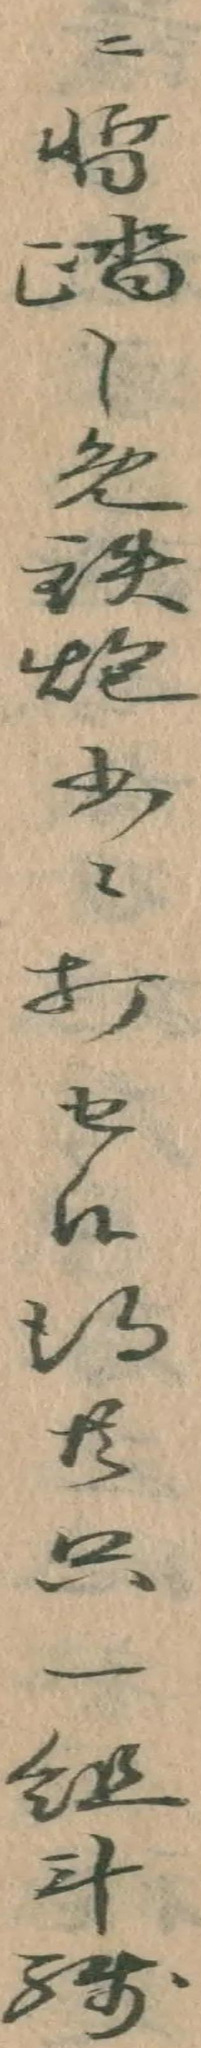に暫踏し免鉄炮少々打せ候得共只一組斗残
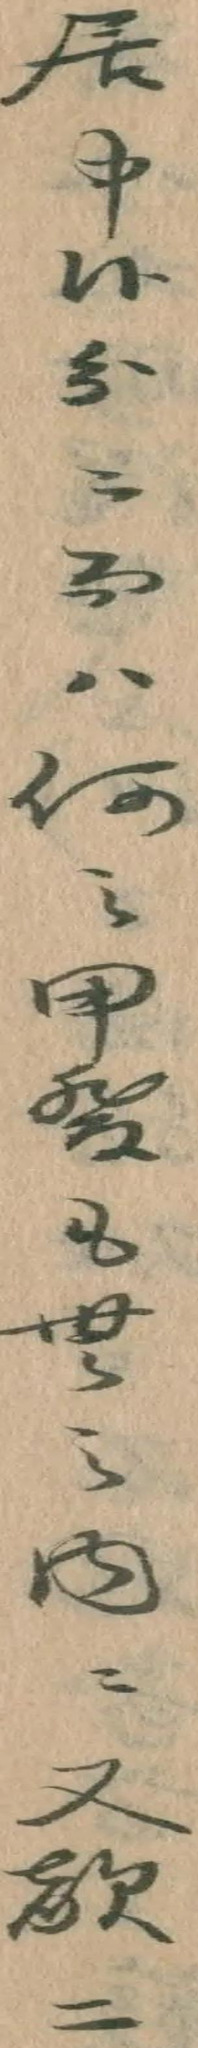居申候分に而は何之甲斐も無之内に又敵に
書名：切支丹御退治記 49巻. [2]
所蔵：国立国会図書館 National Diet Library, JAPAN
